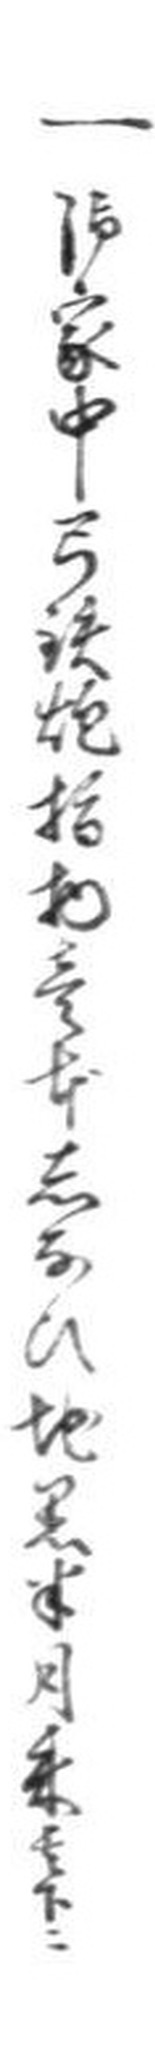一御家中弓鉄炮指物壱本しなひ地黒半月朱其下ニ
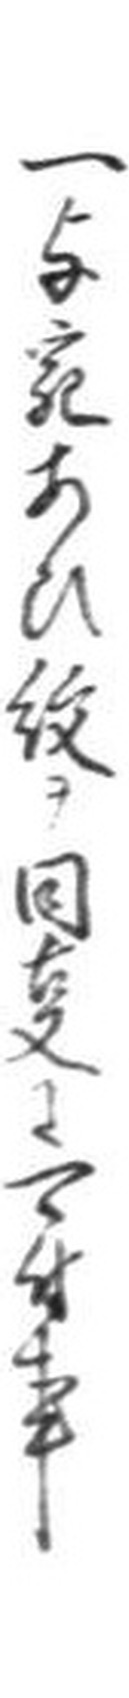一与宛あひ紋ヲ同事に可付事
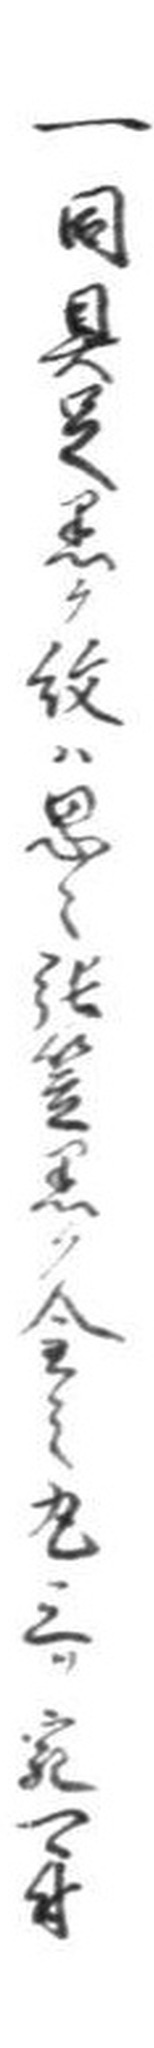一同具足黒ク紋ハ思々張笠黒ク金之丸三ツ宛可付

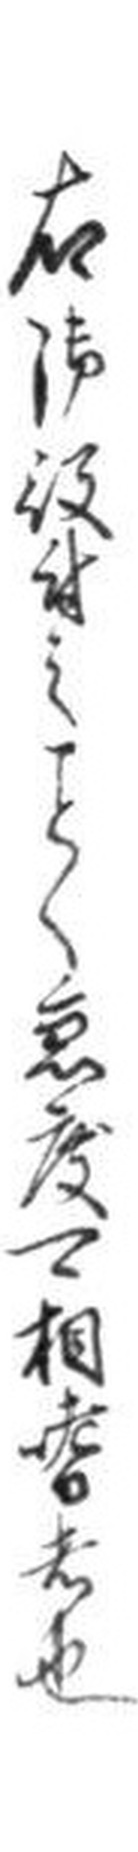右御役付之ことく急度可相嗜者也
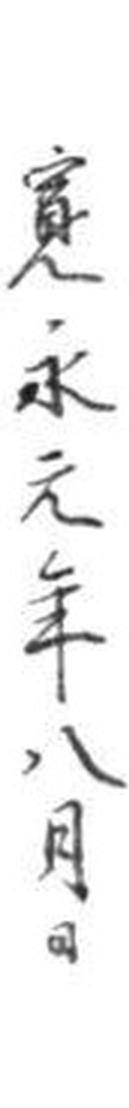寛永元年八月日
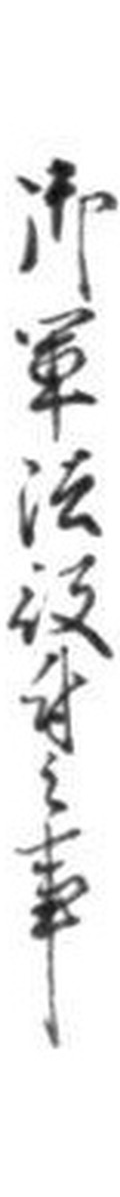御軍法役付之事

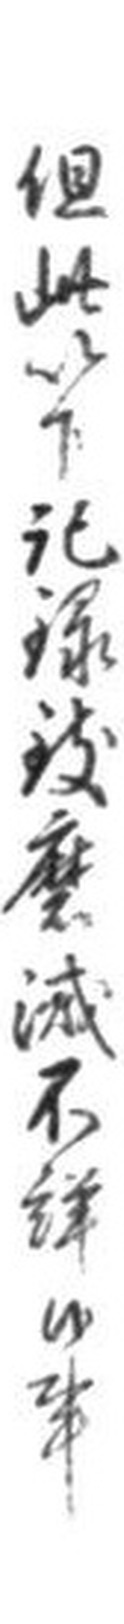但此以下記録致磨滅不詳候事
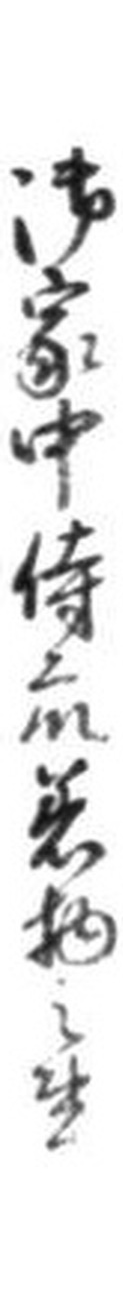御家中侍衆着物之事
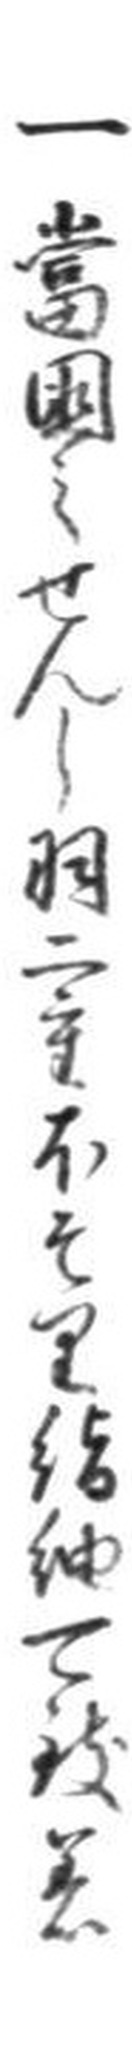一当国之せんし羽二重ほそり絹紬可致着
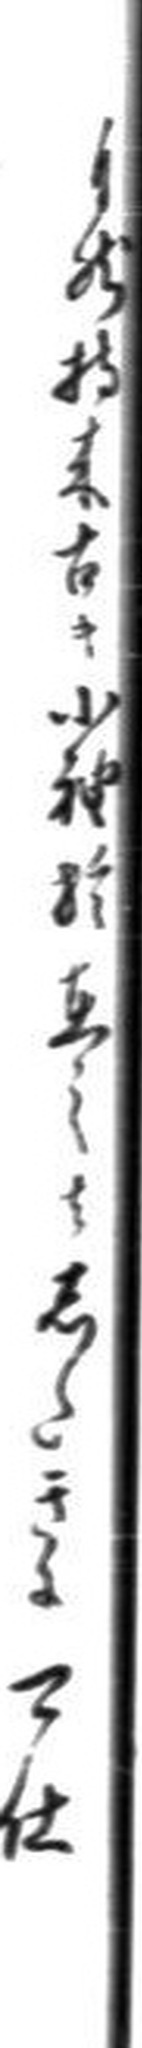自然持来古キ小袖於在之はしたきに可仕
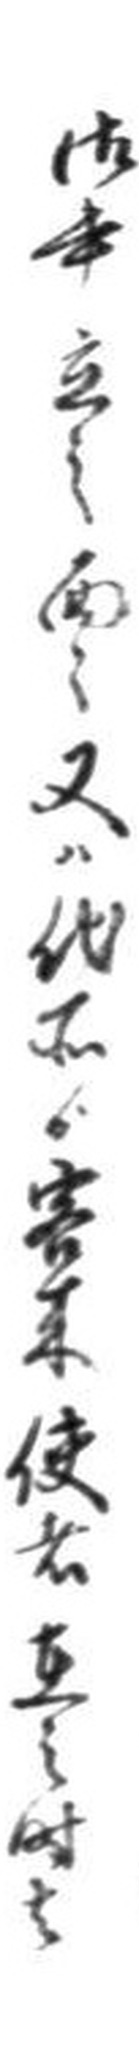御事立之面々又ハ他所より客来使者在之時は
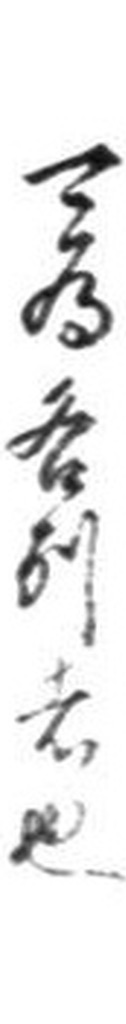可為各別者也
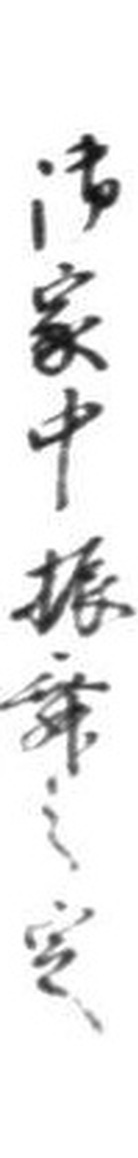御家中振舞之定
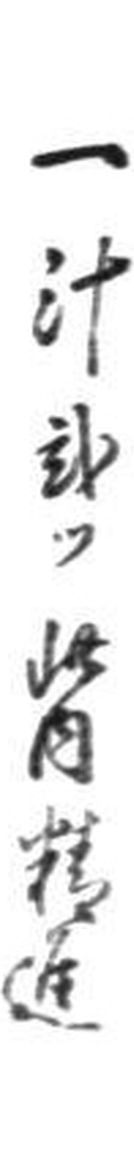一汁弐ッ此内精進
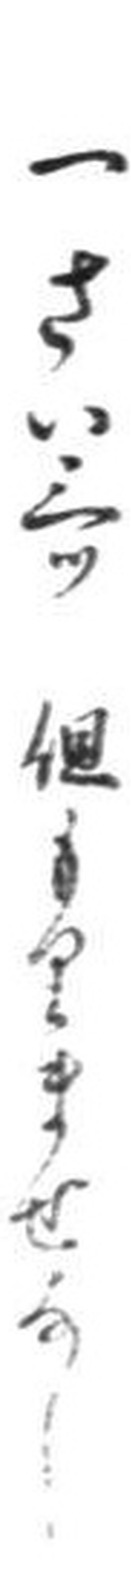一さい三ッ但もりませなし
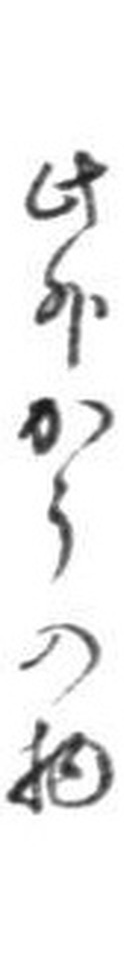此外かうの物
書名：家譜 三 忠昌公 従慶長八年到寛永六年
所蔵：福井県文書館 Fukui Prefectural Archives
